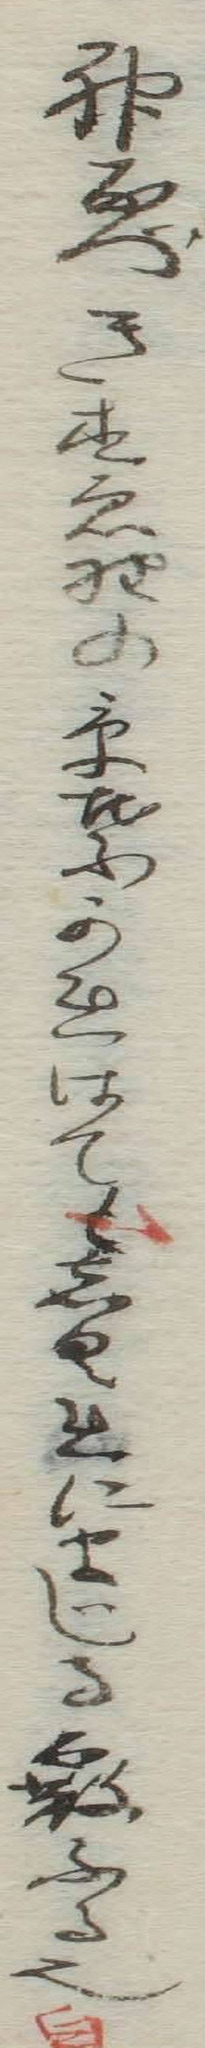神なづきすゑ野の草葉かれはてゝしくれにまじる霰ふる也白

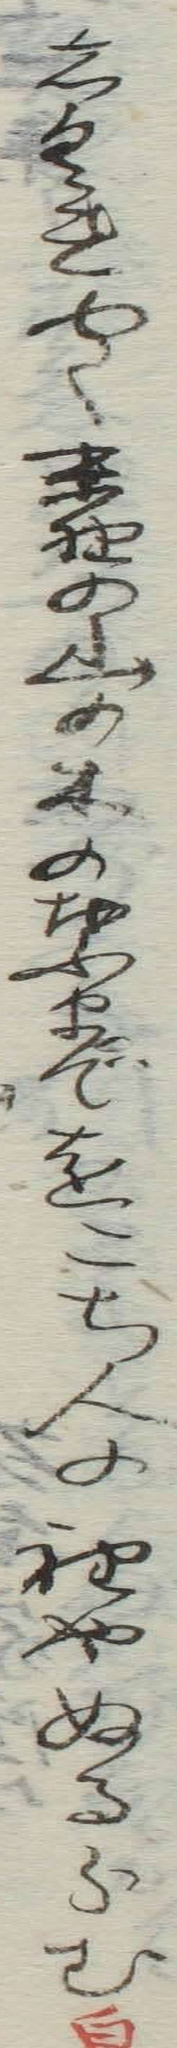しくれゆく末野の山の木の葉までを遠こち人の袖やぬるらむ白
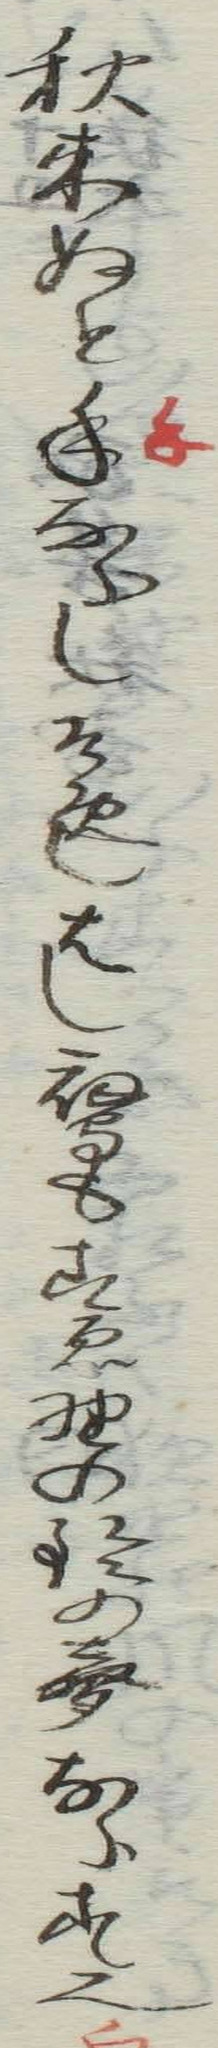秋来ぬと手ならしそめしはし鷹もすゑ野の鈴の声ならす也白
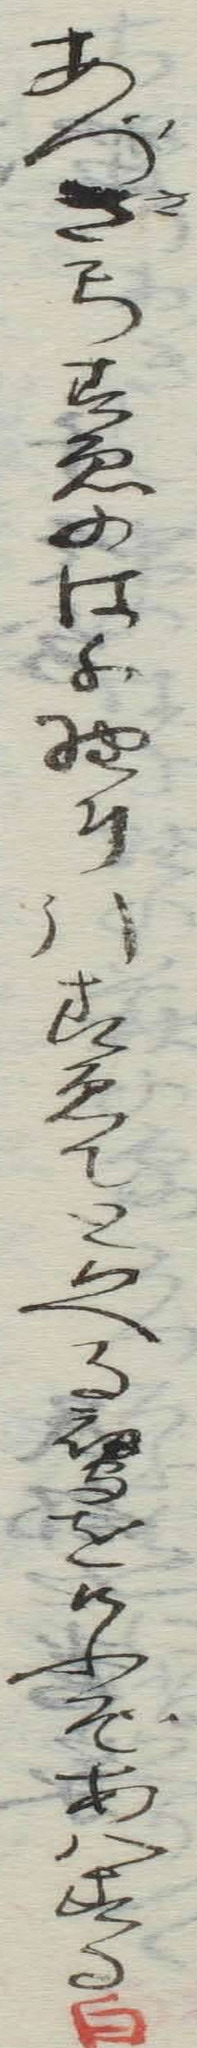あづさ弓すゑのはら野に引すゑてとかへる鷹をけふぞあはする白
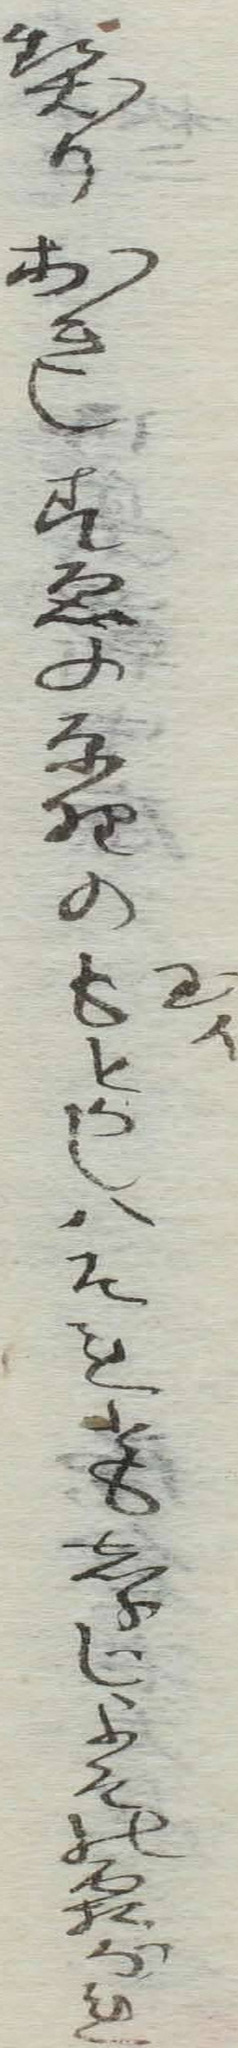契りおきしすゑの原野のもとかしはそれともしらじよその霜がれ白
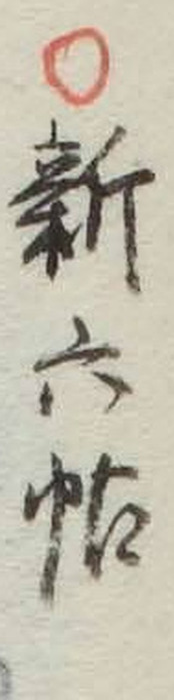○新六帖
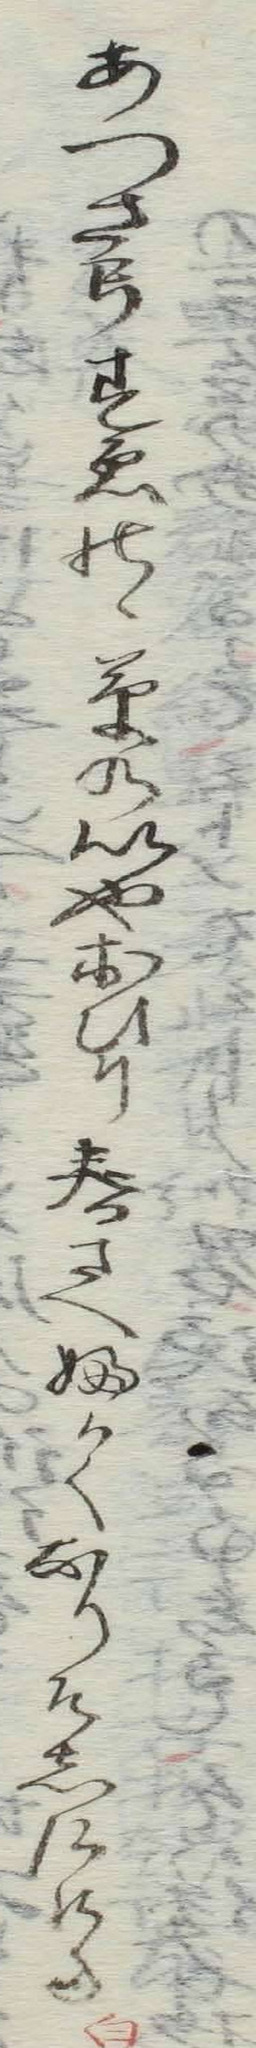あつさ弓すゑのゝ草のいやおひに春さへふかくなりそしにける白
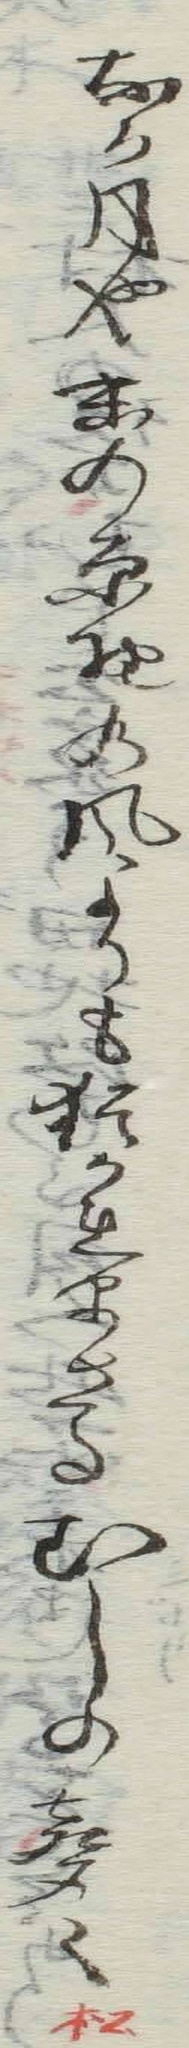なか月や末の原野の風よりも猶かれまさるむしの声々松
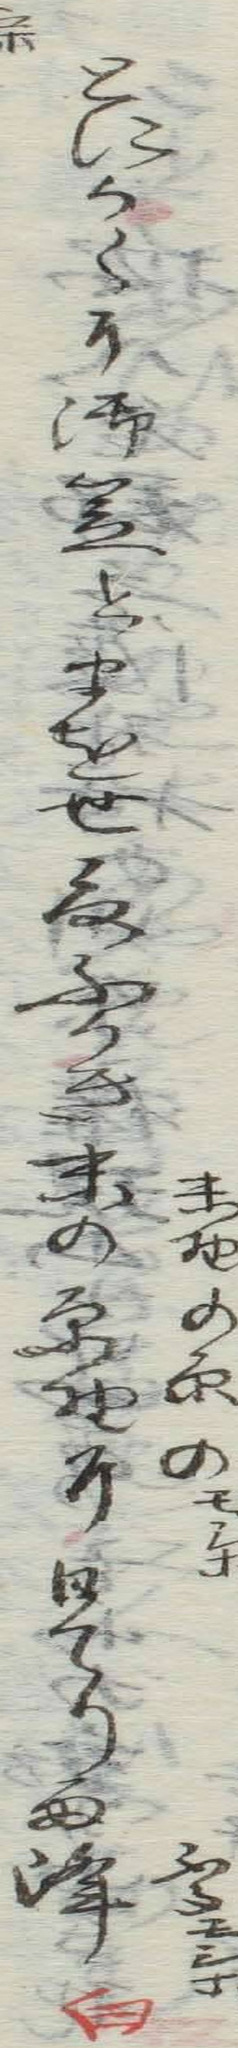とにかくに御笠とまをせ夏ふかき末の原野に日てり雨降白
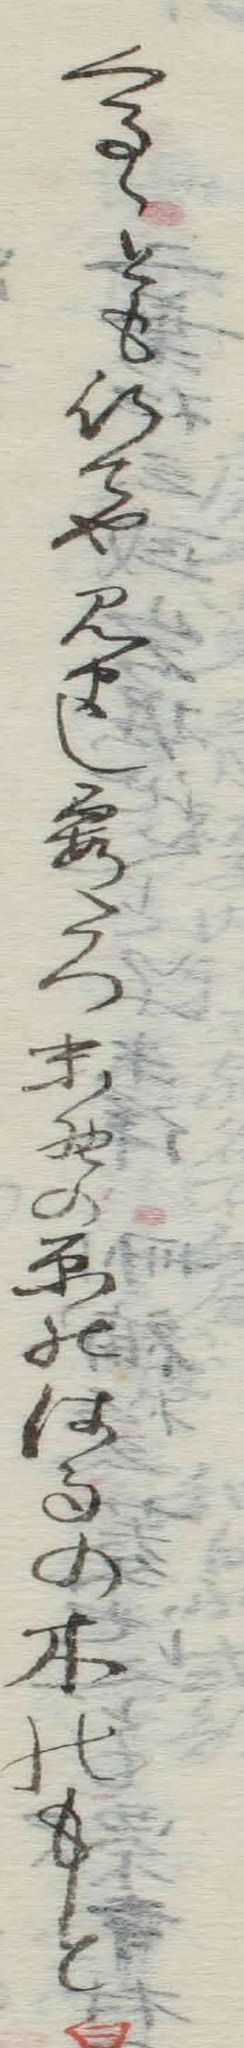くるゝとも行てや見まし霞たつ末野の原のはるの木のもと白

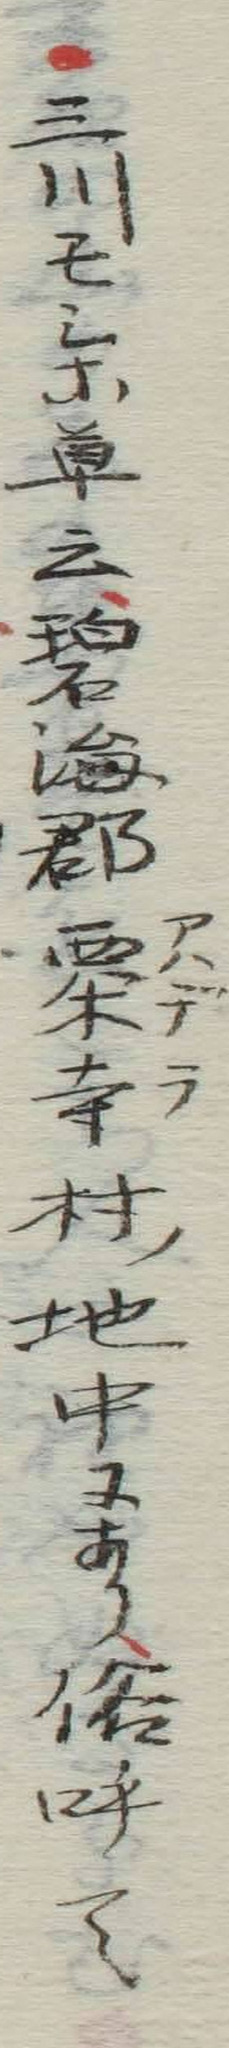●三川モシホ草云、碧海郡粟寺村ノ地中にあり、俗呼て
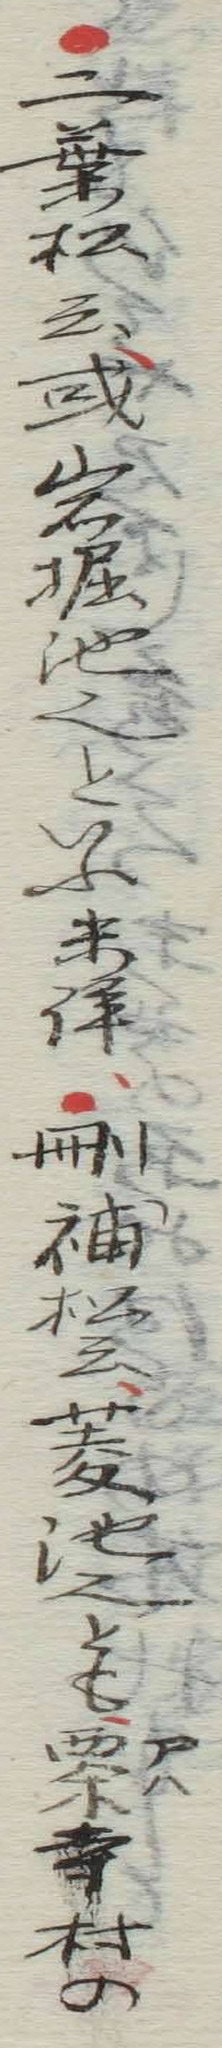●二葉松云、或岩堀池也といふ未詳、●刪補松云、菱池也とも、粟寺村の
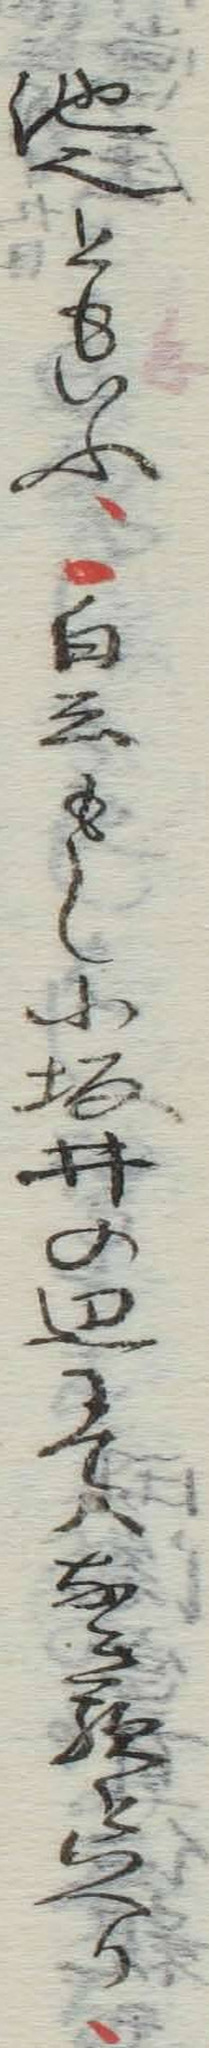池也ともいふ、白云もし小坂井の辺にてはなき歟といへり、
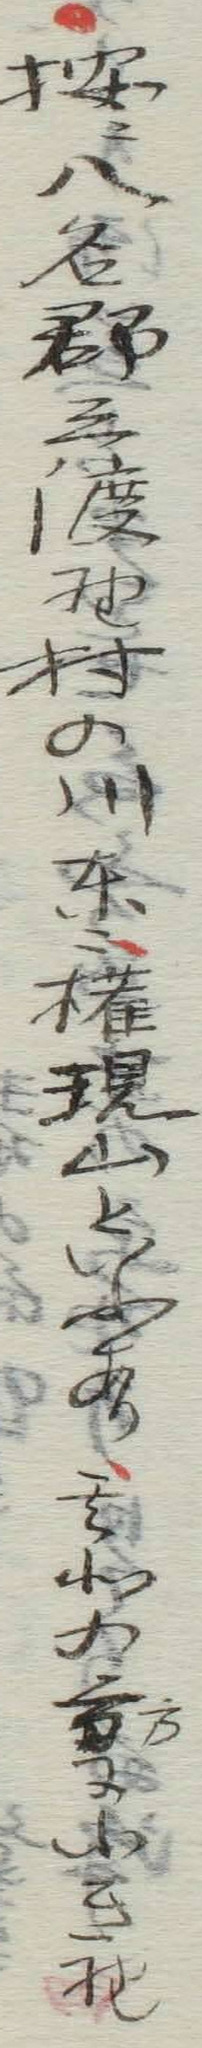●按ニ八名郡三渡野村の川東ニ、権現山といふあり、其北の方に小き野
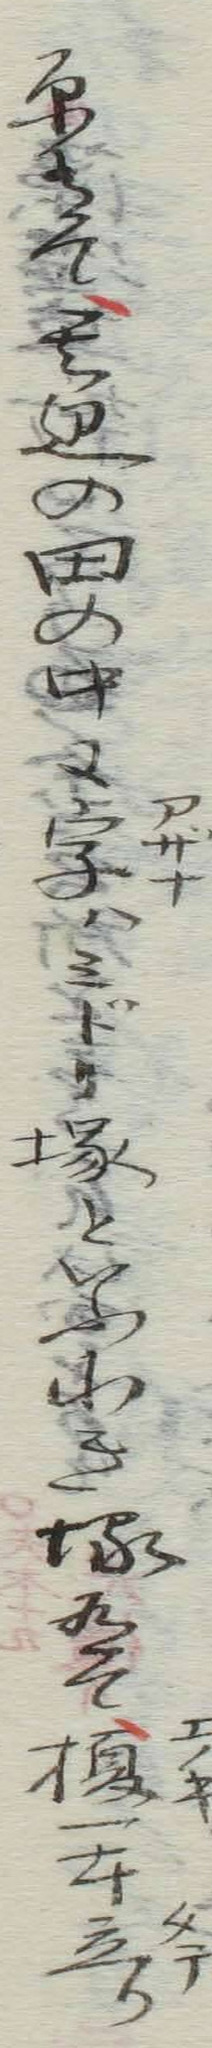原有て、其辺の田の中に字はミドリ塚といふ小き塚有て、榎一本立り
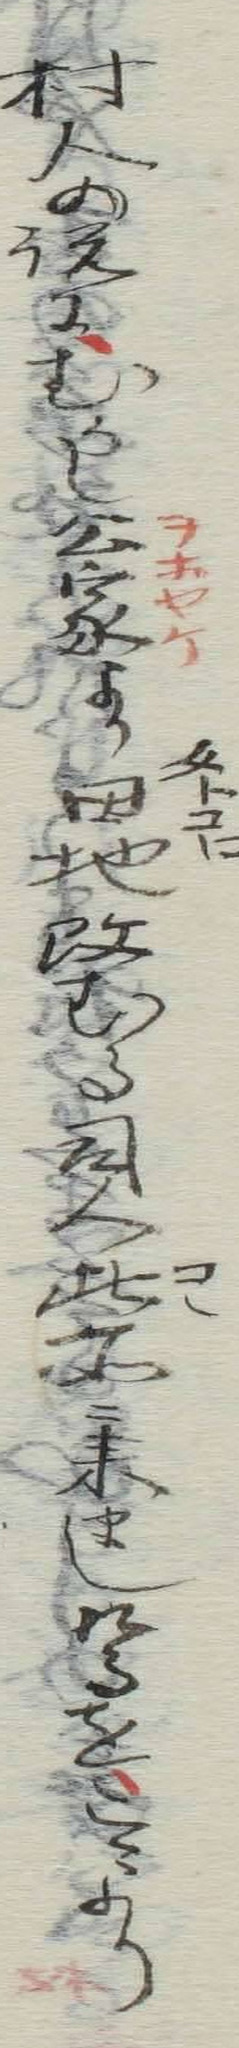村人の説に、むかし公家より田地改むる司人此所ニ来ましけるをこゝより
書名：三河国古跡考
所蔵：国文学研究資料館
